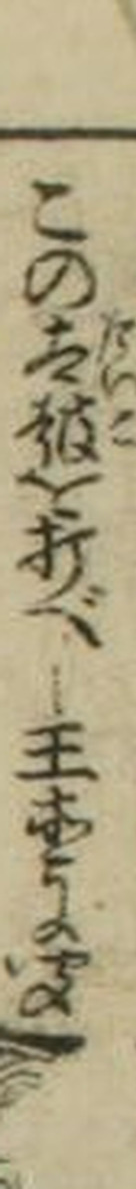この太鼓を打べし王直に聞
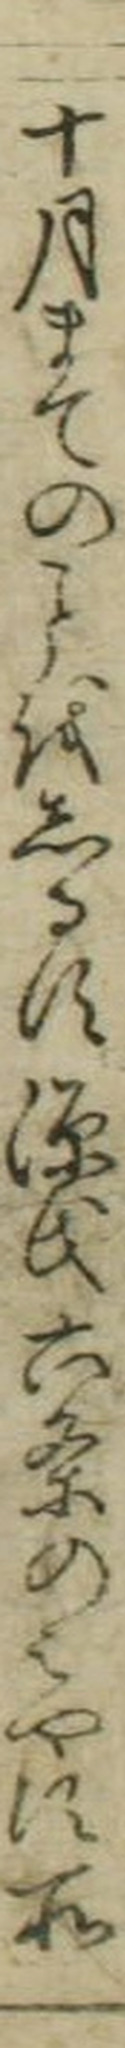十月まてのことをしるす。源氏六条のみやす所
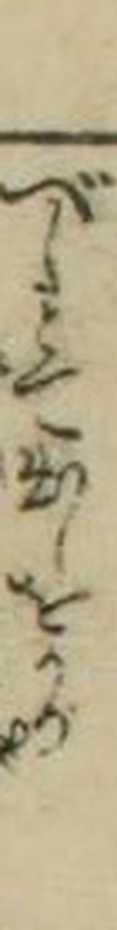べしとて出しをかる
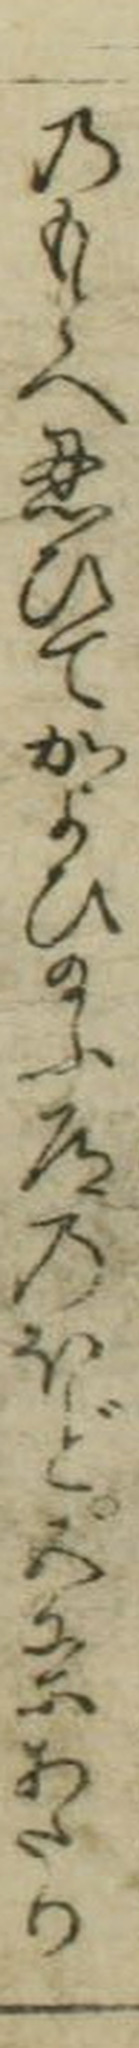のもとへ忍ひてかよひ給ふ道のほど。五条あたり
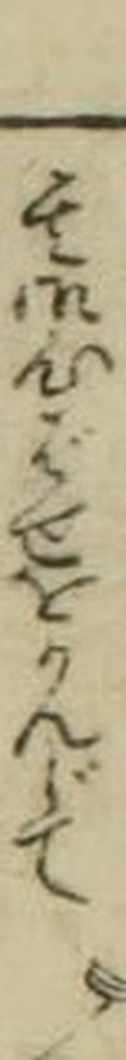其御心ばせをかんじて
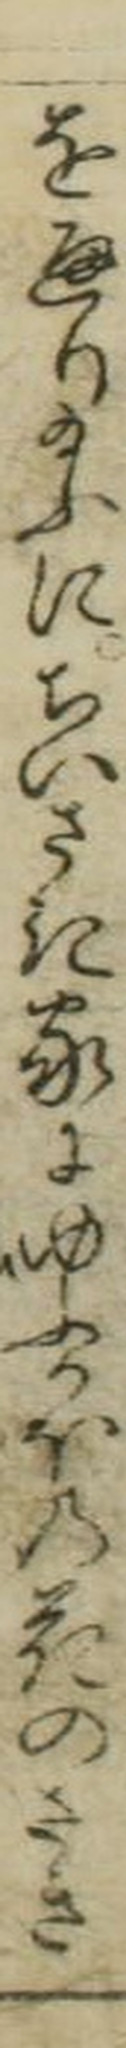を通り給ふに。ちいさき家にゆふかほの花のさき
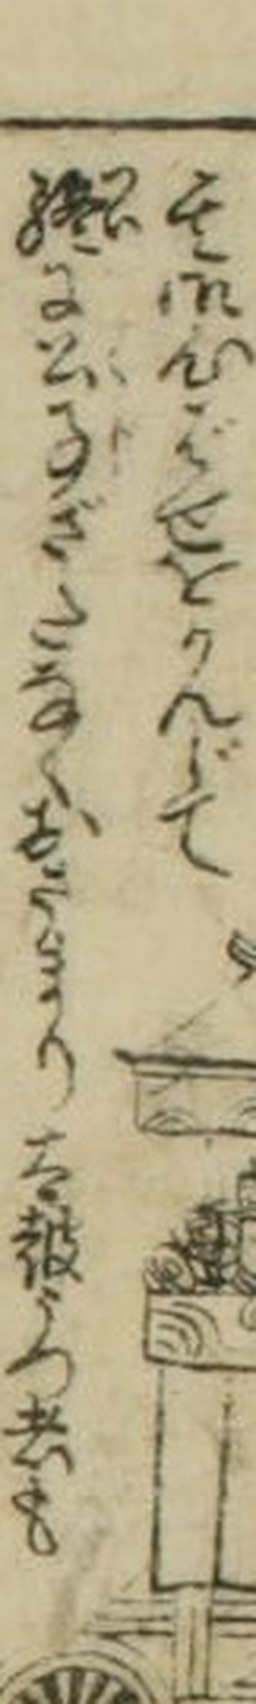終に公事ざたなくおさまり太鼓うつ者も
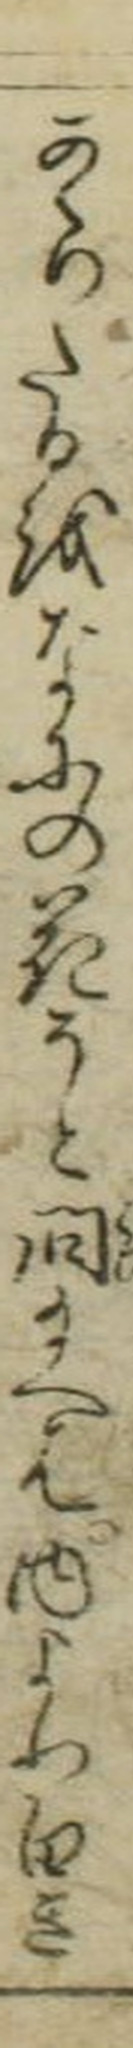かゝりたるをなにの花そと問給へは。内より白き
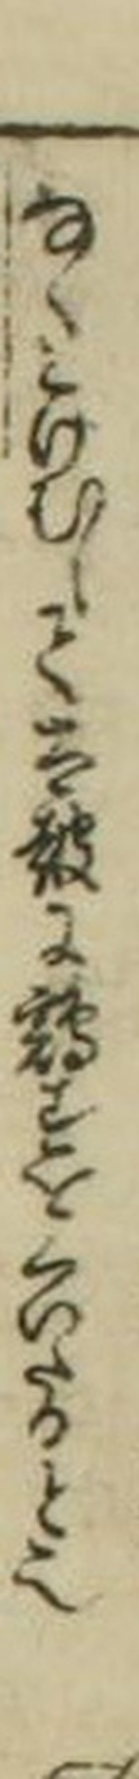なくこけむして太鼓に鶏すをくいたると也
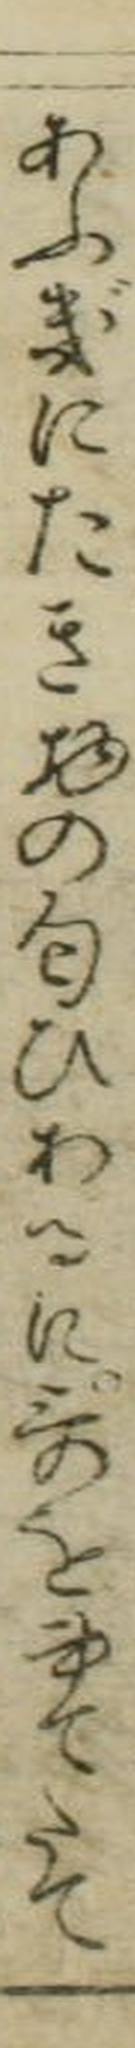あふぎにたき物の匂ひあるに。哥を書てたて
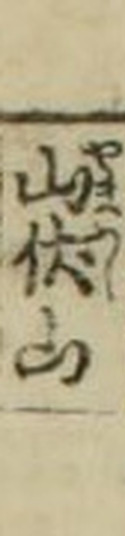山伏山
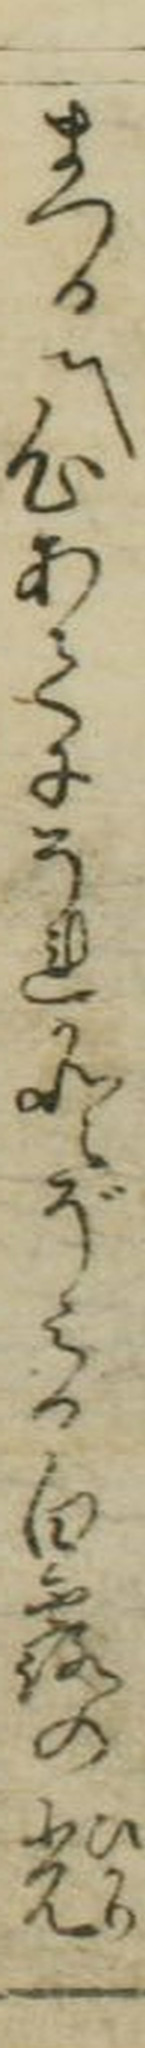まつる〽心あてにそれかとぞみる白露の光
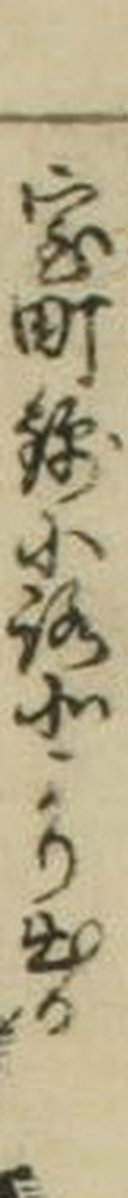室町錦小路北より出る
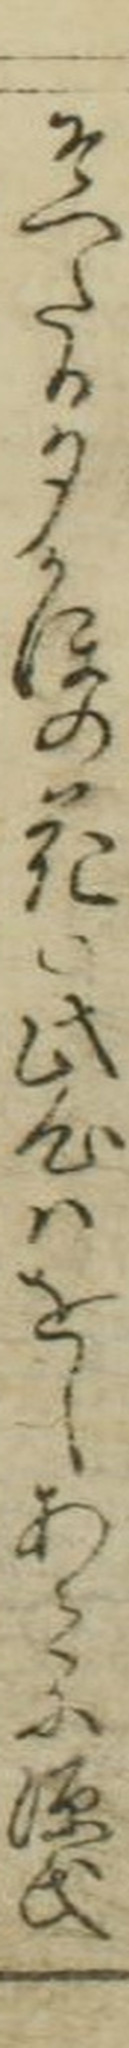そへたる夕かほの花○此心はをしあてに源氏
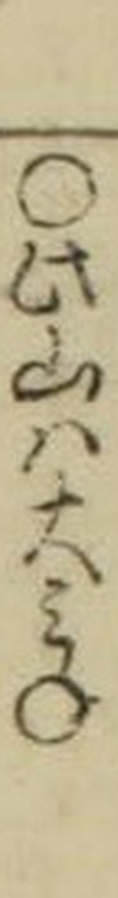○此山は大みね
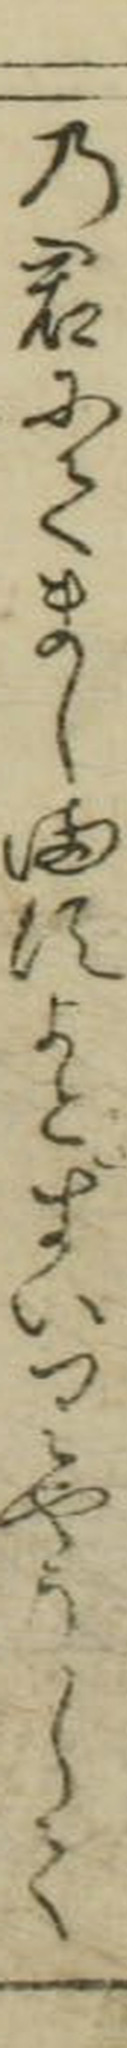の君にてましますよと。すいりやうして
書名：女源氏教訓鑑
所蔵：東京学芸大学附属図書館
